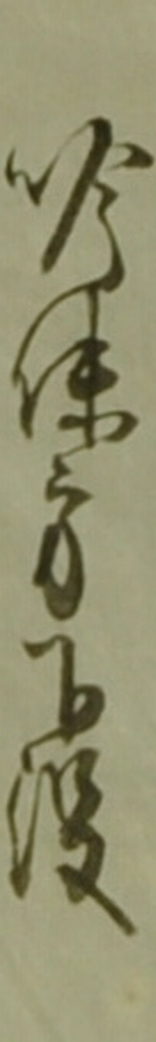吟味方下役
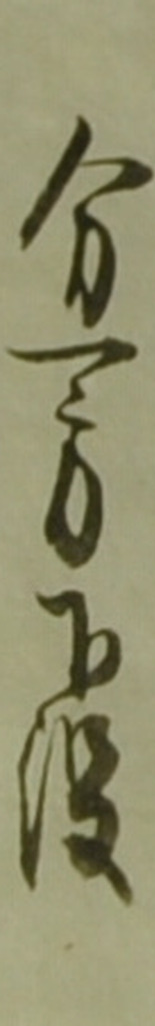分一方下役
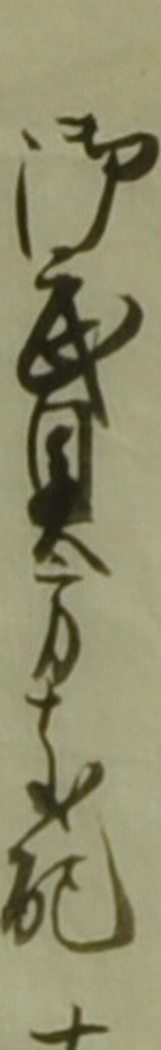御武具方下役
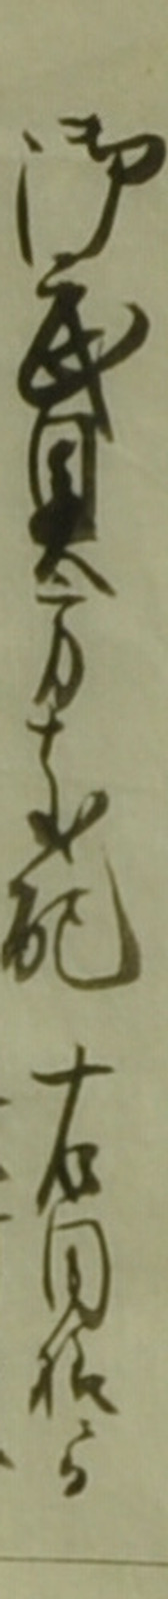御武具方支配右同様二而
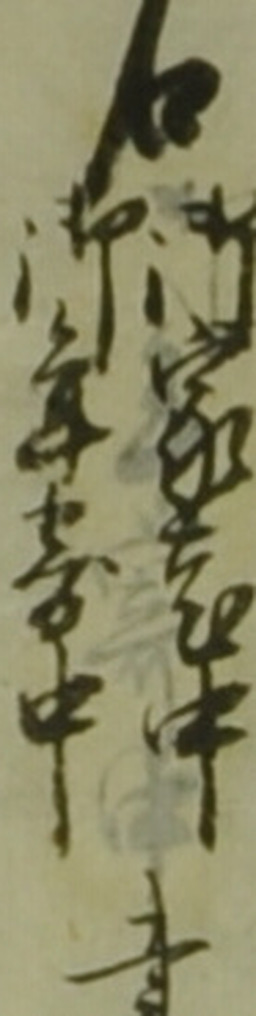御年寄中

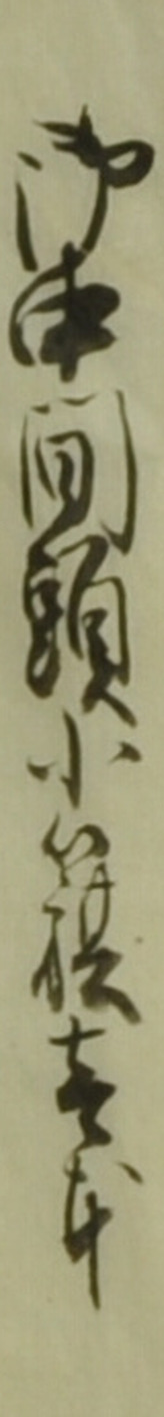御中間頭小旗壱本
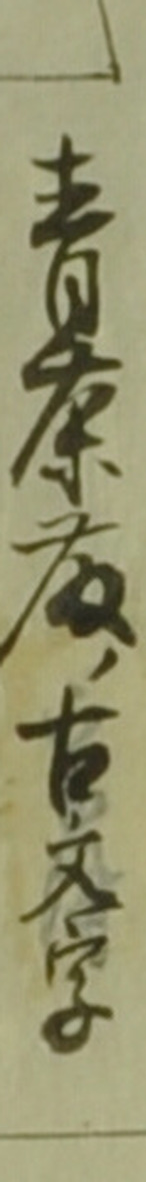青茶藤ノ古文字
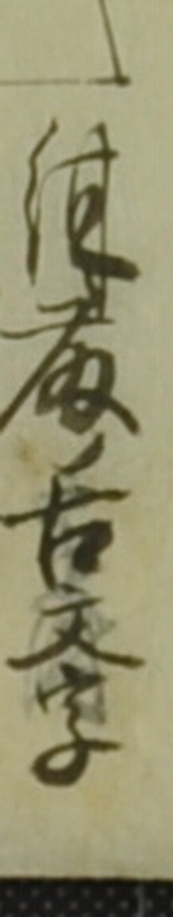青茶藤ノ古文字
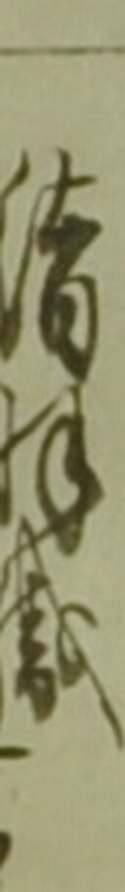麻羽織
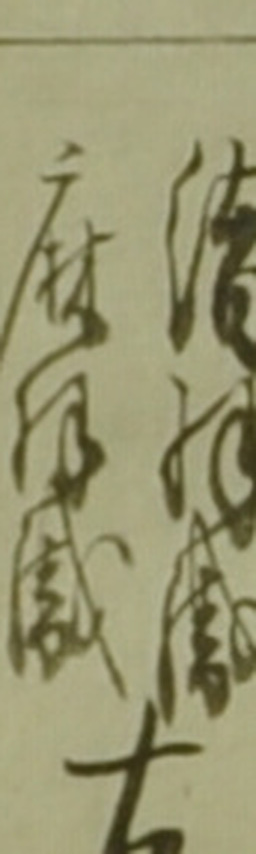麻羽織

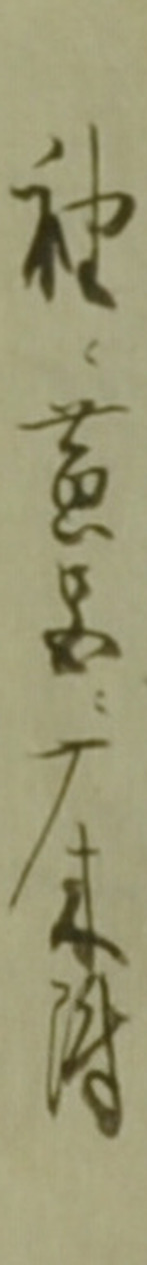袖二黄色二雁木附
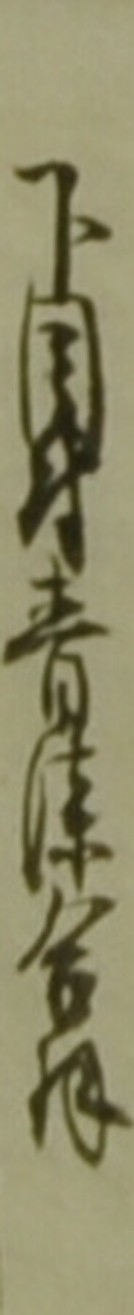下目付青染合羽
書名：諸向御相印定法帳
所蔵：伊那市立高遠町図書館・合同会社AMANE
